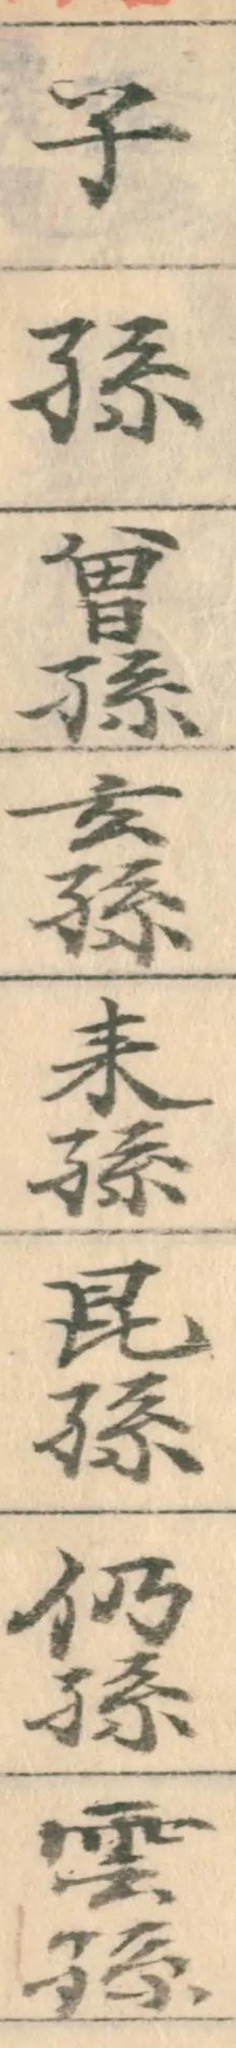子孫曽孫玄孫来孫昆孫仍孫雲孫
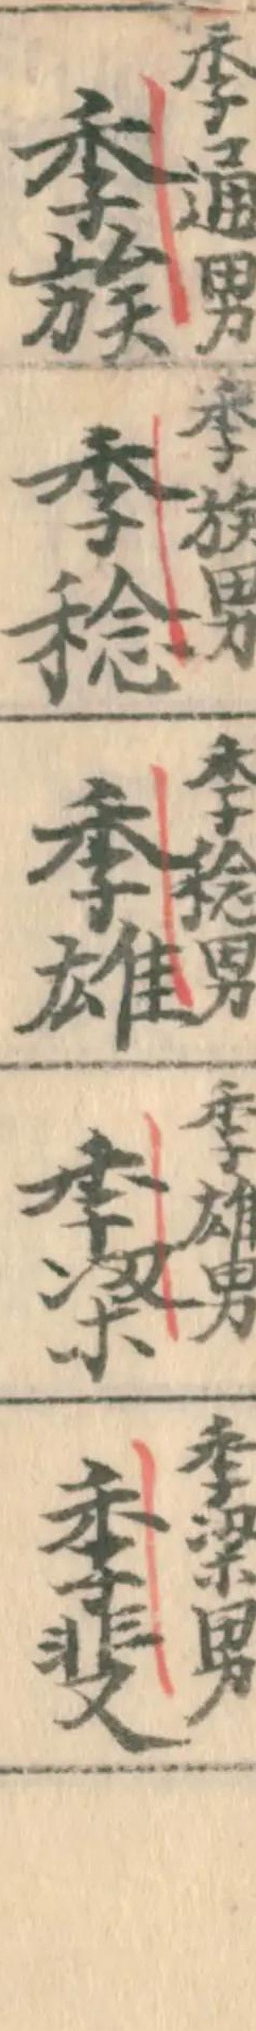季族季稔季雄季梁季斐季的
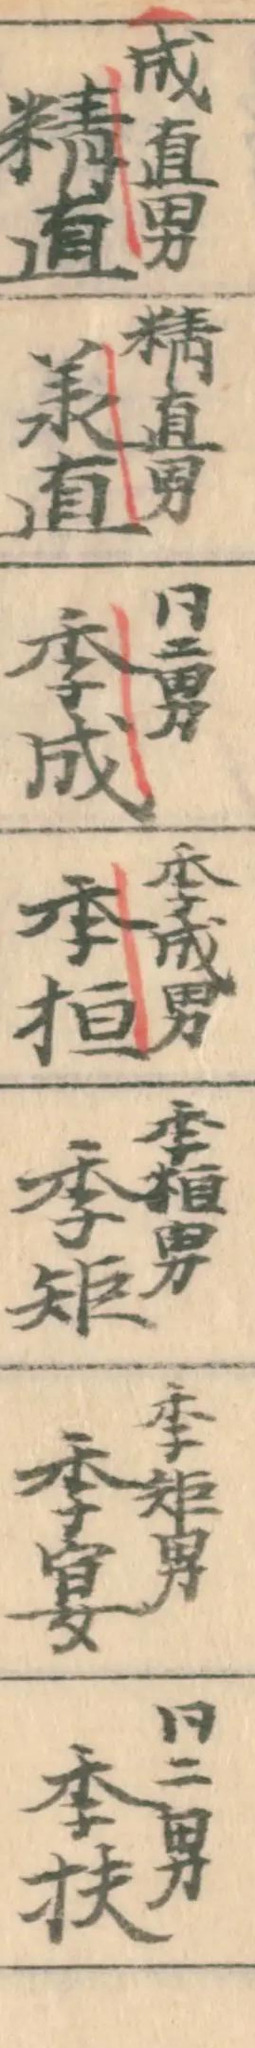精直承直季成季桓季矩季宴季扶
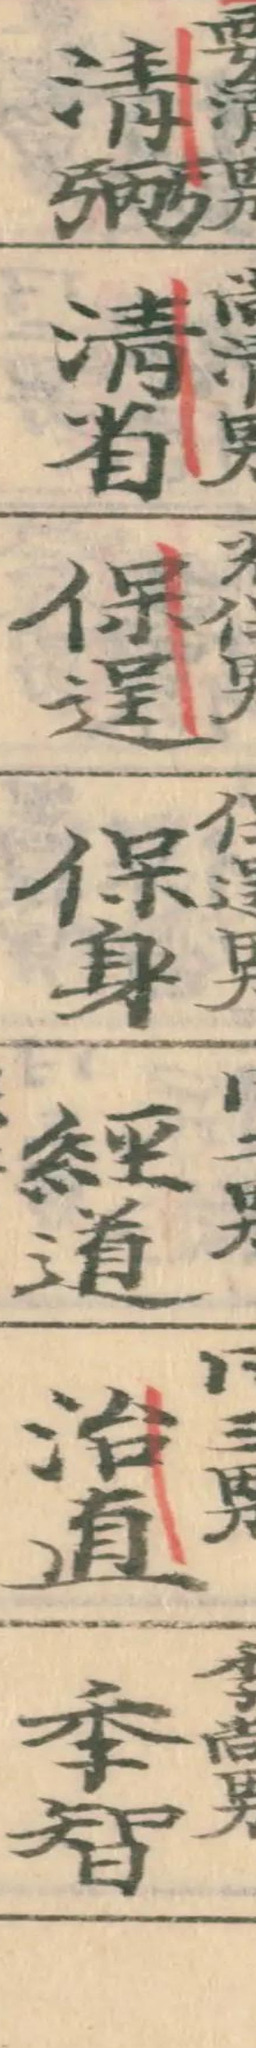清弻清省保逞保身経道治直季智
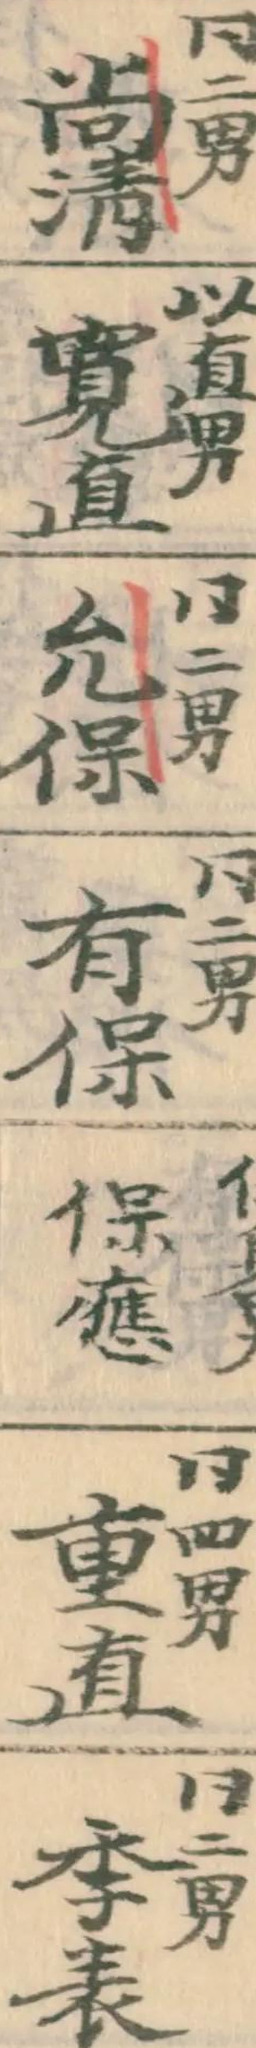尚清寛直允保有保保応重直季表

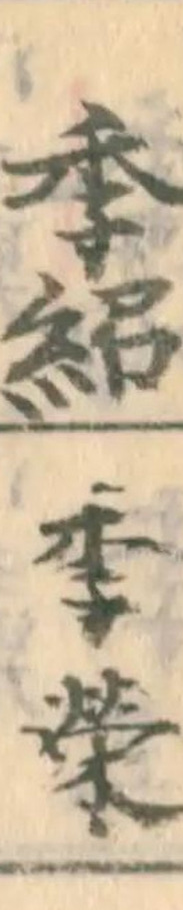季紹季榮
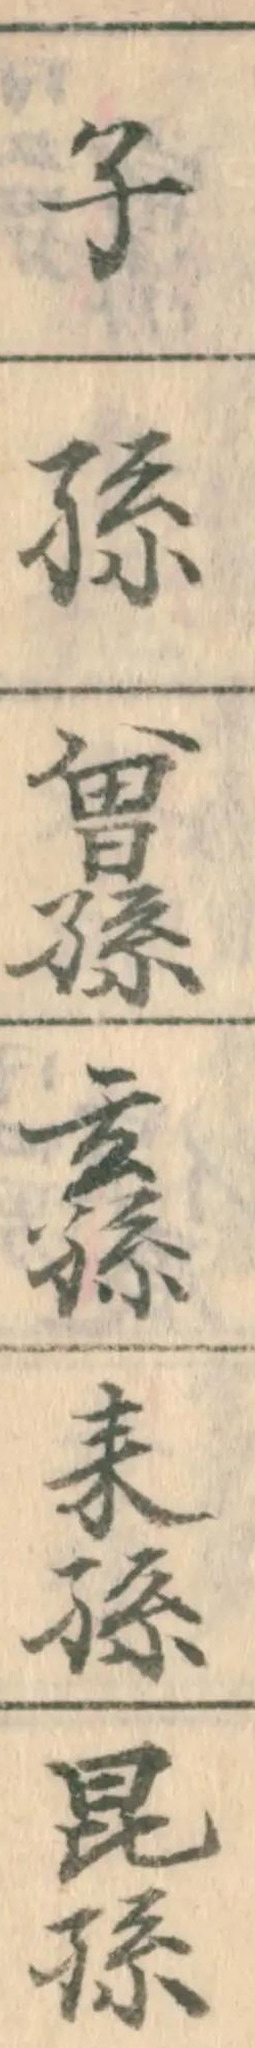子孫曽孫玄孫来孫昆孫
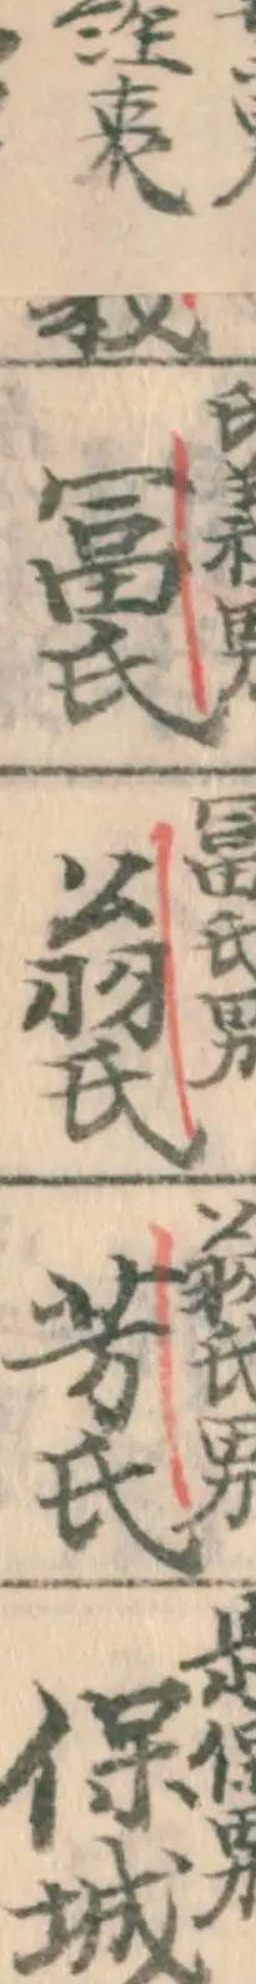経表冨氏翁氏芳氏保城
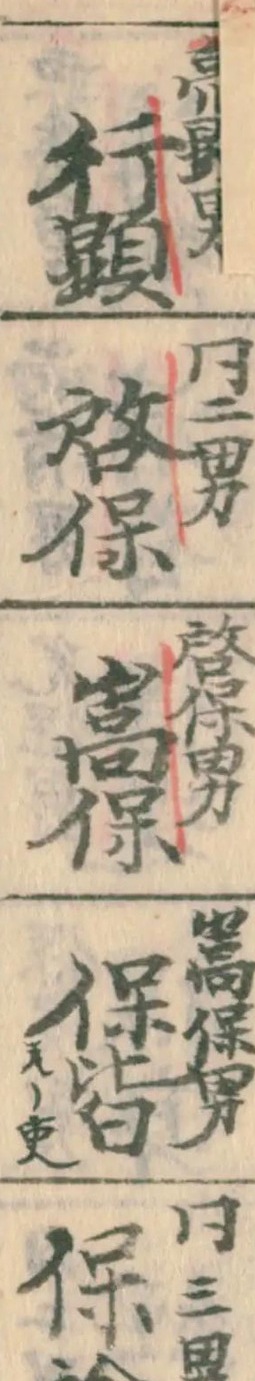行顕啓保嵩保保皆保稔
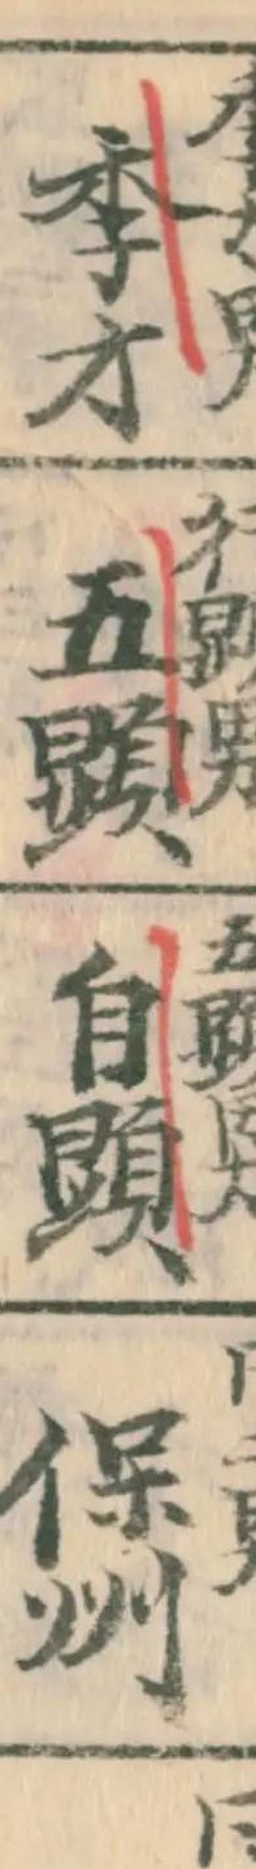季才五顕自顕保州
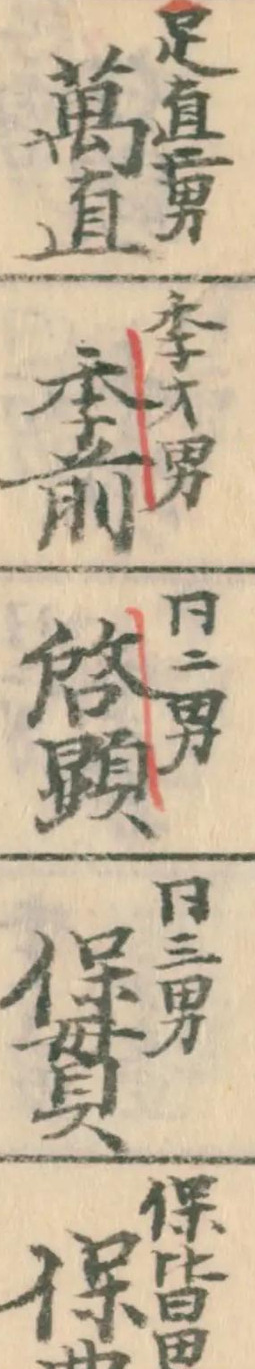萬直季前啓顕保貫保典

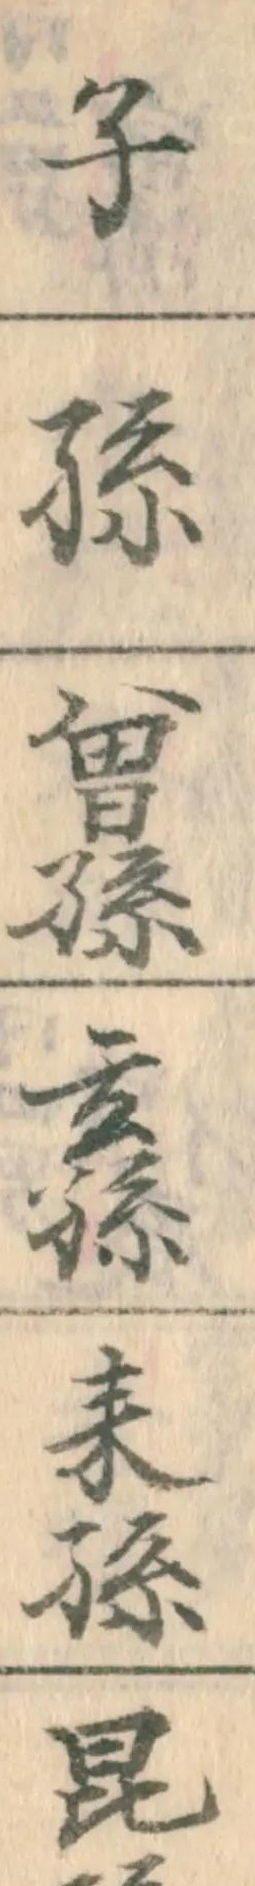子孫曽孫玄孫来孫昆孫
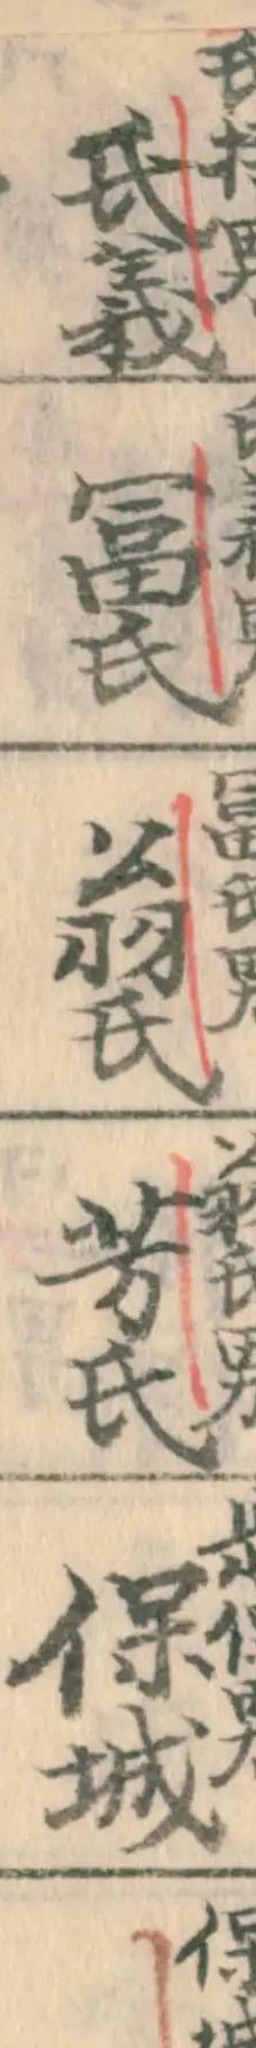氏義冨氏翁氏芳氏保城
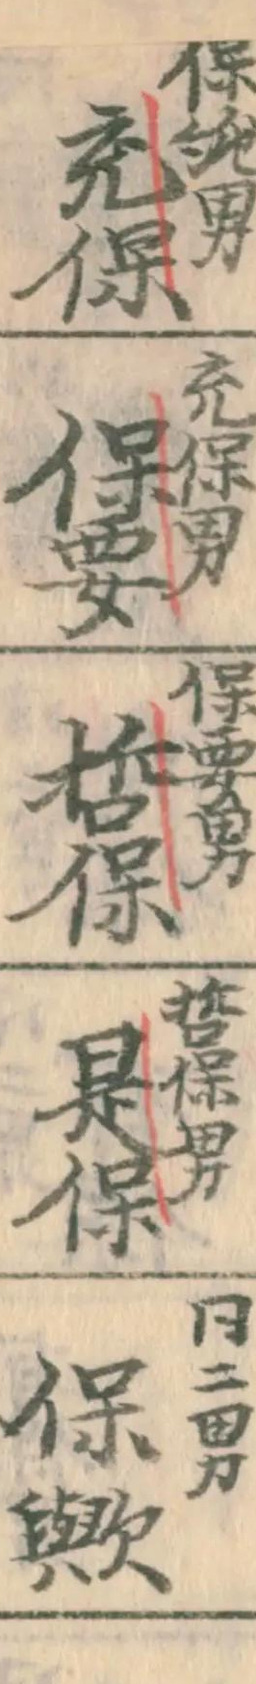充保保要哲保是保保歟
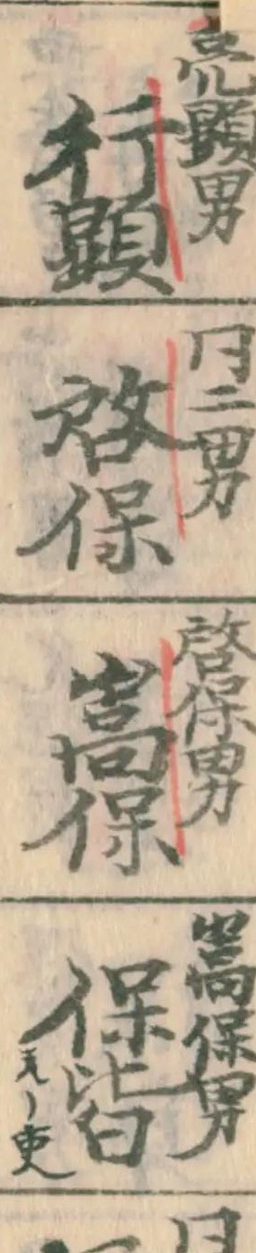行顕啓保嵩保保皆保稔
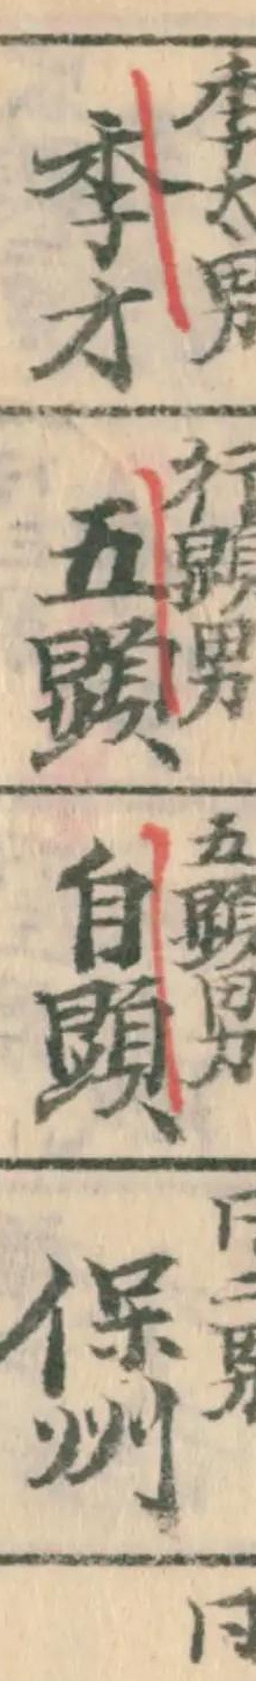季才五顕自顕保州
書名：賀茂社記録. 第24冊
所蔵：国立国会図書館 National Diet Library, JAPAN
